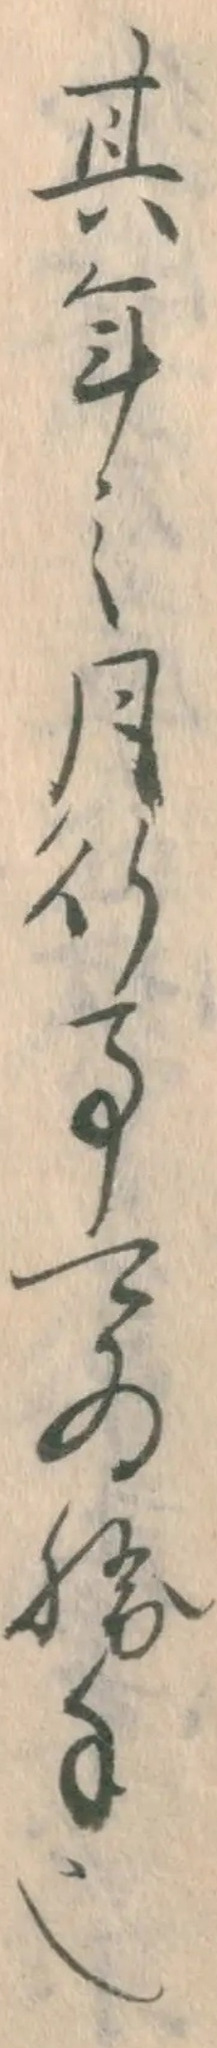其年之月行事可為勝手也
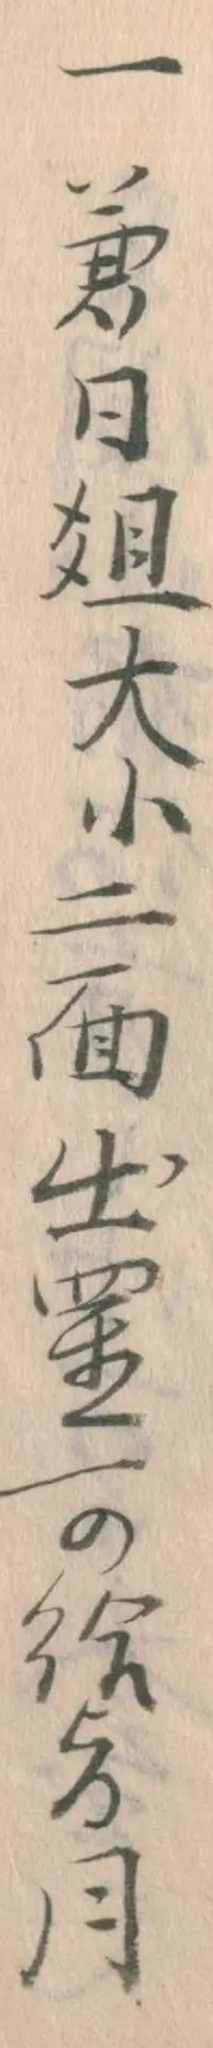一兼日俎大小二面出置可給旨月
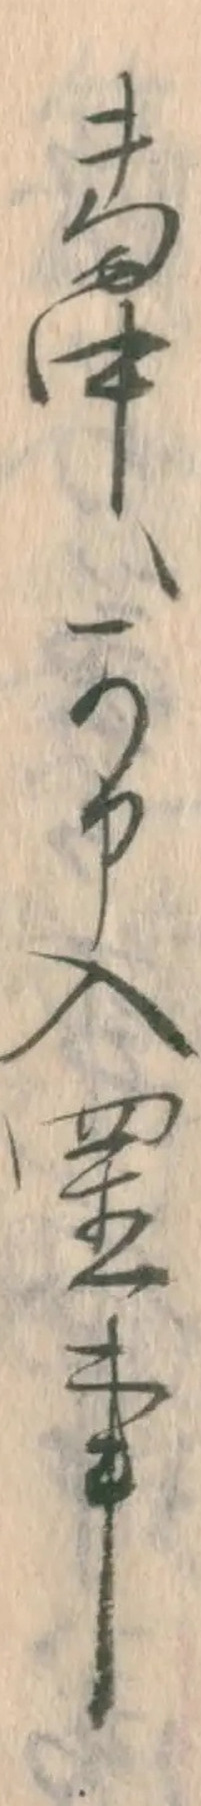番中へ可申入置事
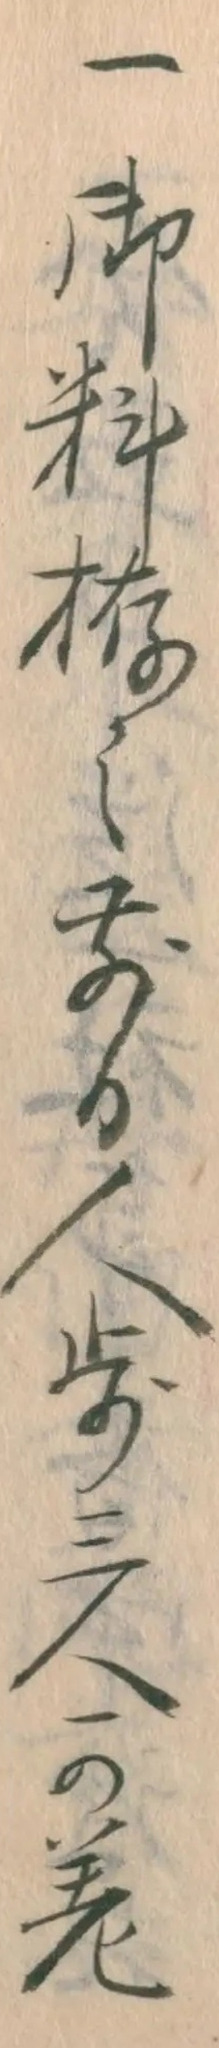一御料拵之前日人歩三人可差
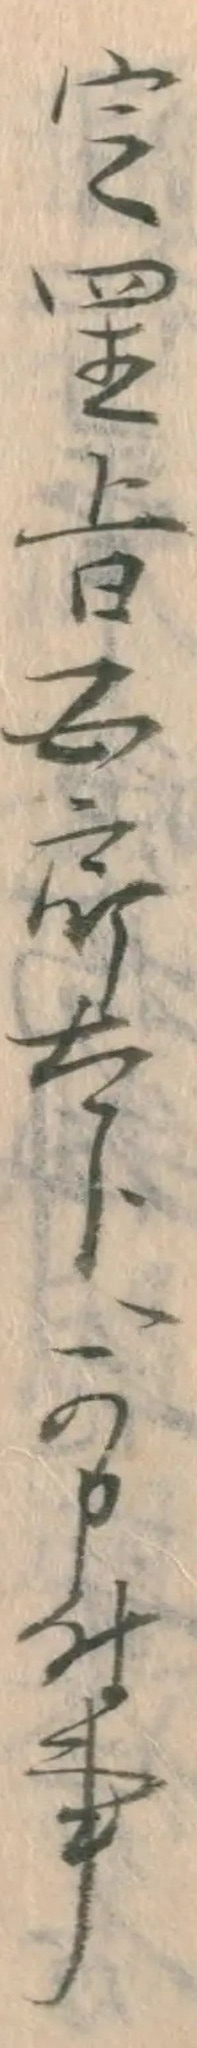定置旨五郎太郎へ可申付事
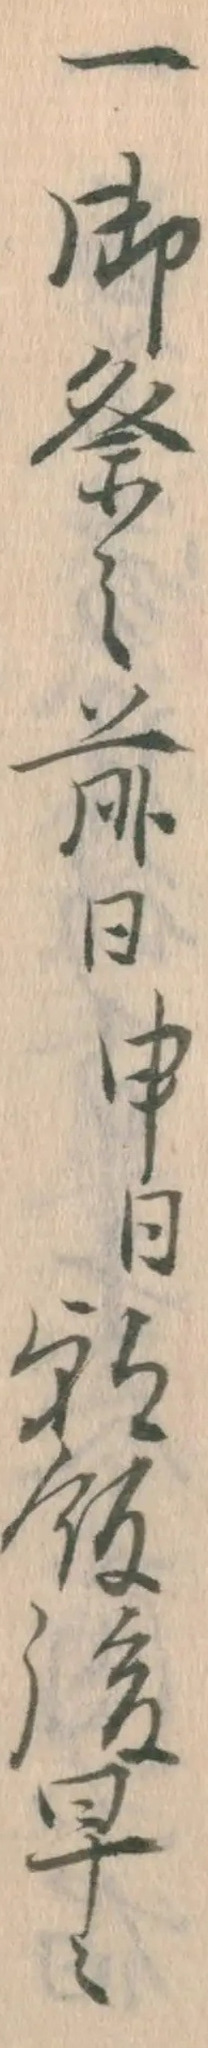一御祭之前日申日朝飯後早々
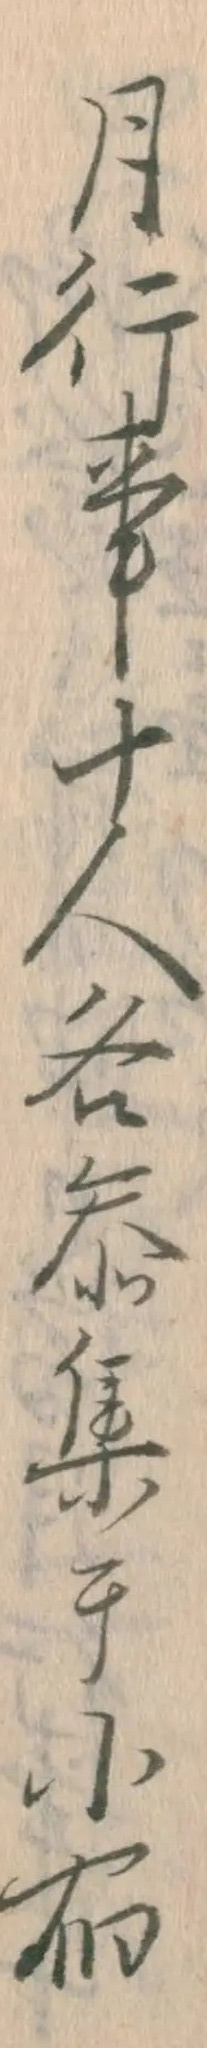月行事十人各参集于小宿
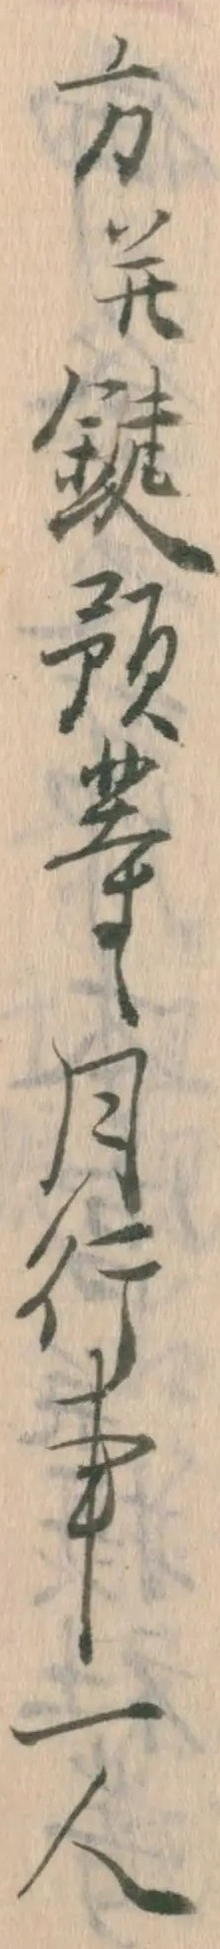方并鍵預等へ月行事一人
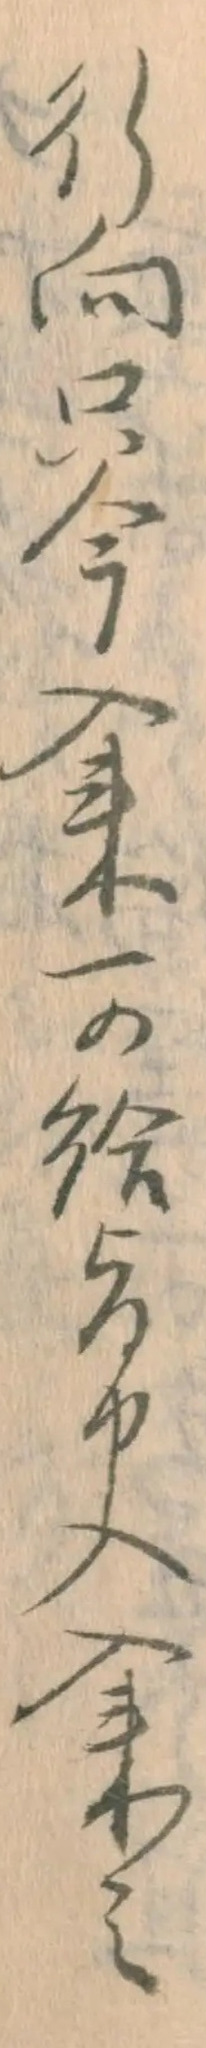行向只今入来可給旨申入入来之
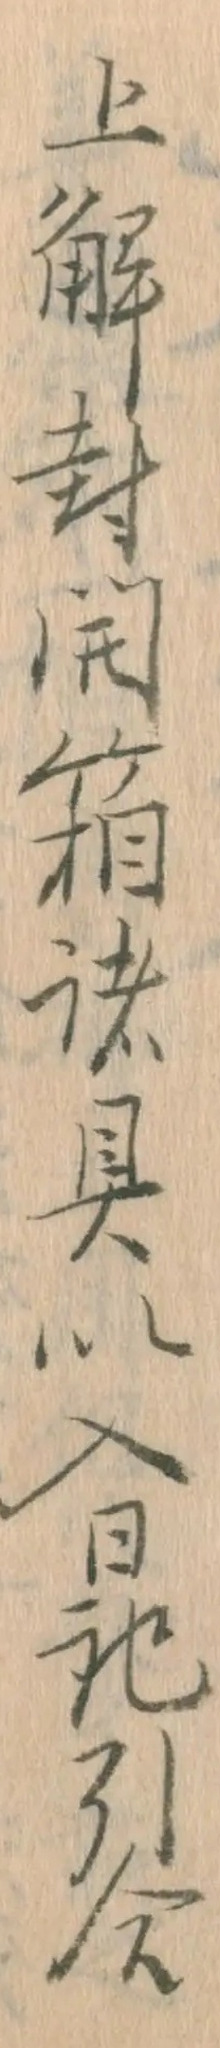上解封開箱諸具以入日記引合
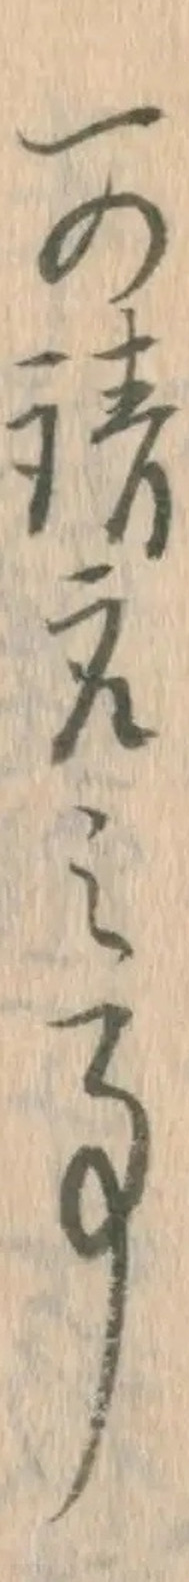可請取之事
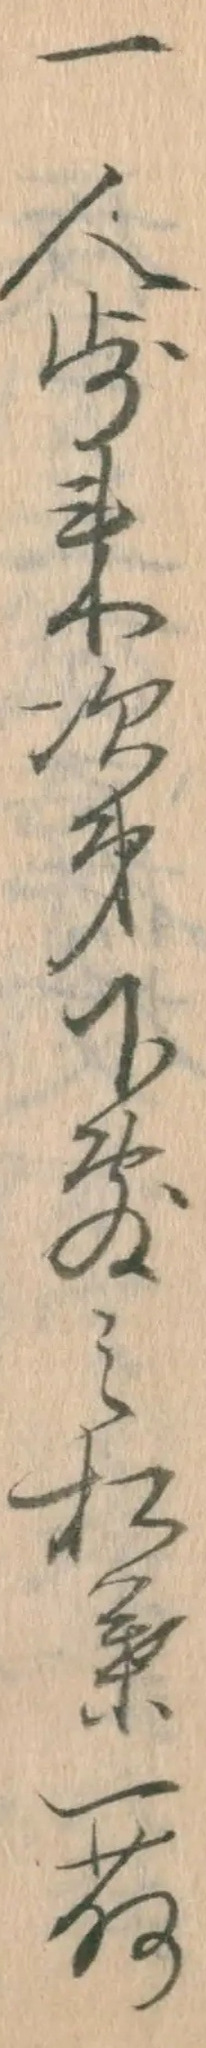一人歩来次第下敷之松葉一荷
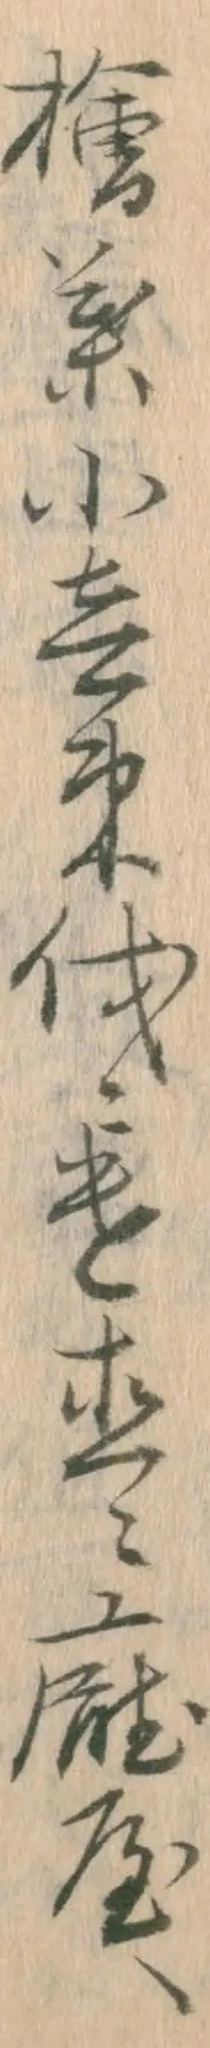桧葉小壱束伐候遣直々庁屋へ
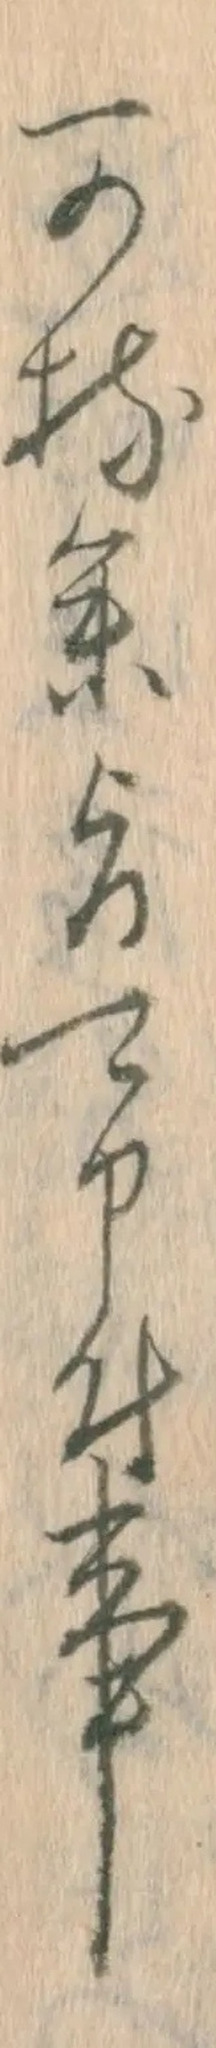可持参旨可申付事
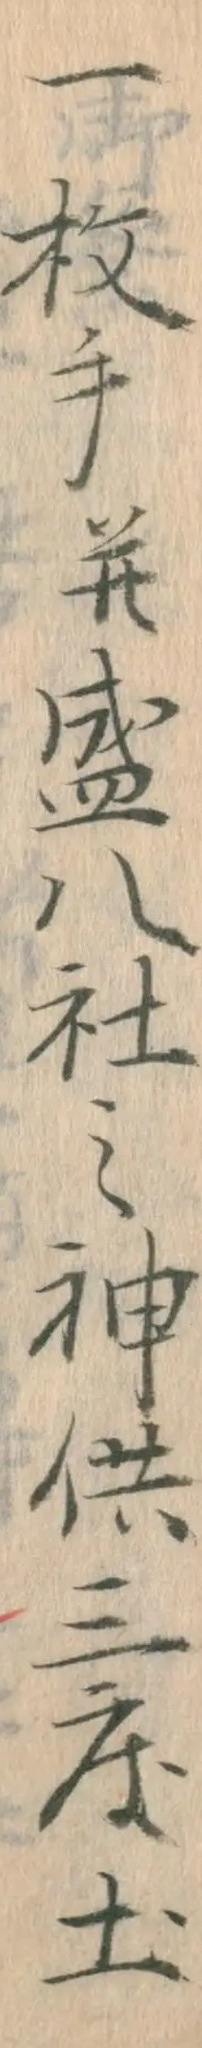一枚手并盛八社之神供三度土
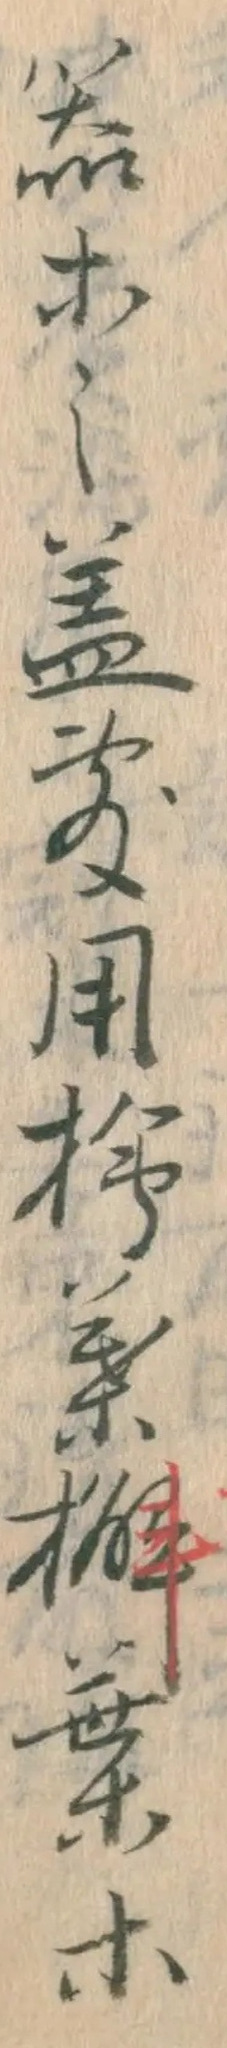器等之蓋敷用桧葉槲葉等
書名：賀茂社記録. 第81冊
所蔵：国立国会図書館 National Diet Library, JAPAN
